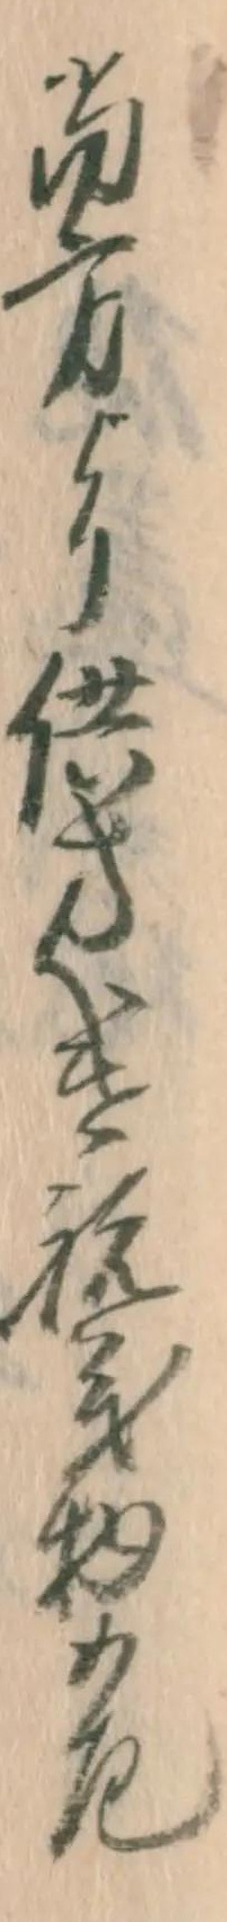當方より供方へ遣祝義物如左
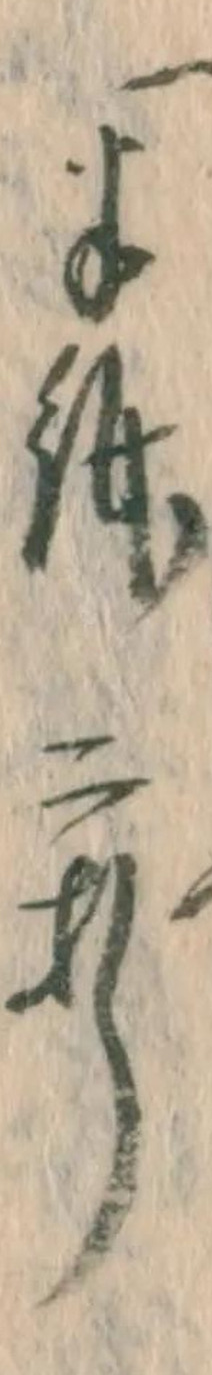半紙二折
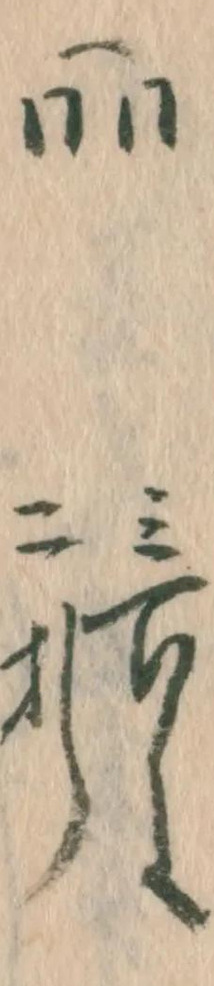同二折
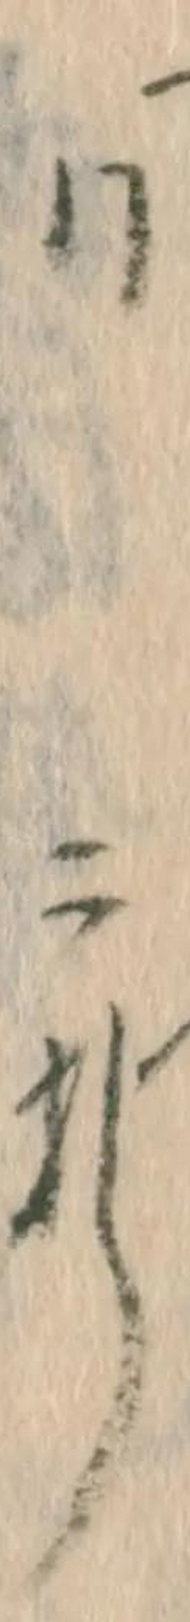同二折
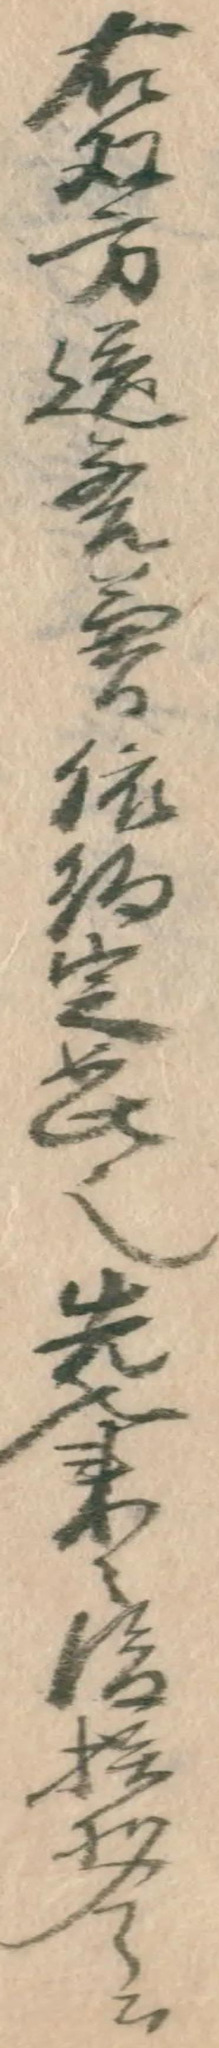右双方送答兼而依約定如此也先入来之後挨拶了而
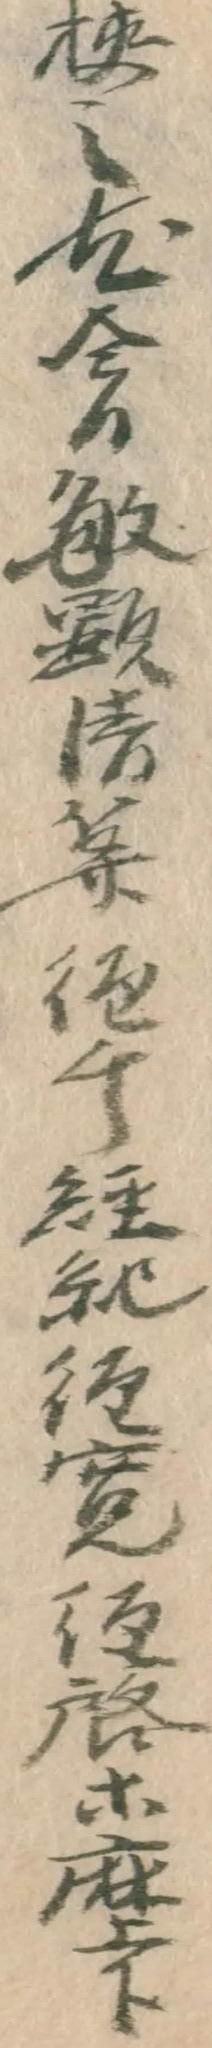挟之尤今日敏顕清筭経千経紀経寛経啓等麻上下
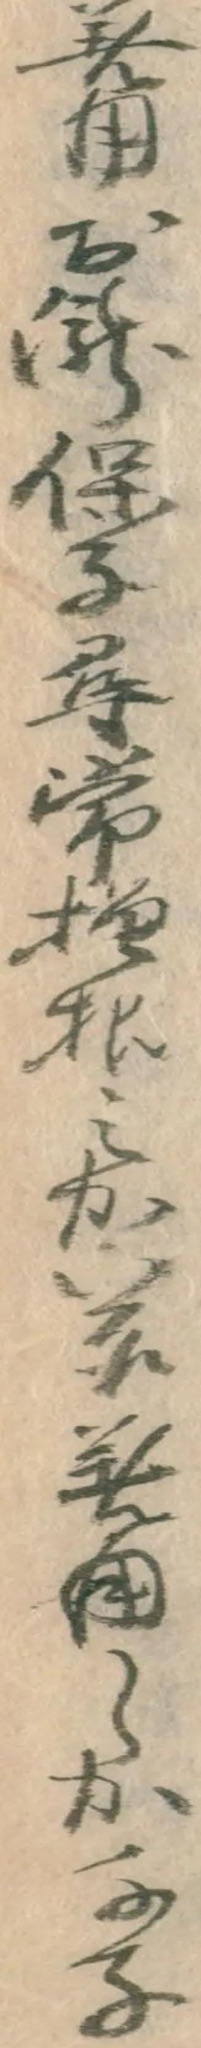着用於瀧保子尋常模様之加着用しか千子

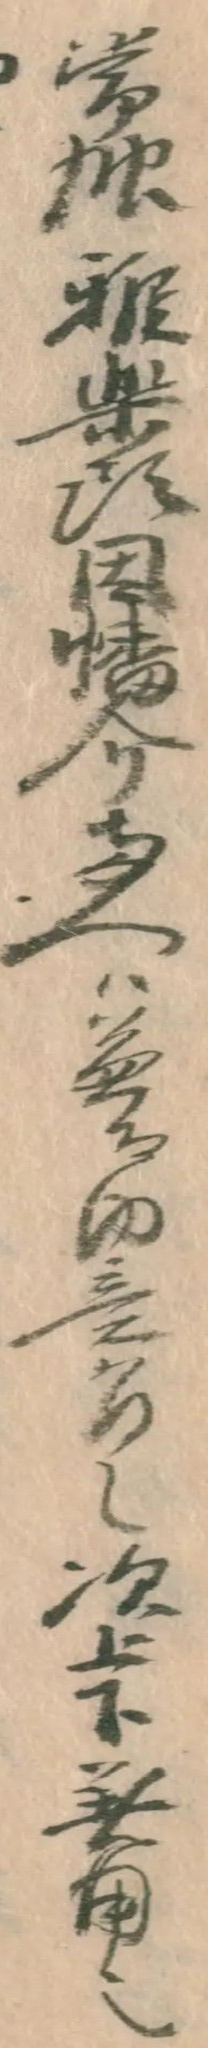常服雅楽頭因幡介両人ハ兼而内意有之次上下着用也
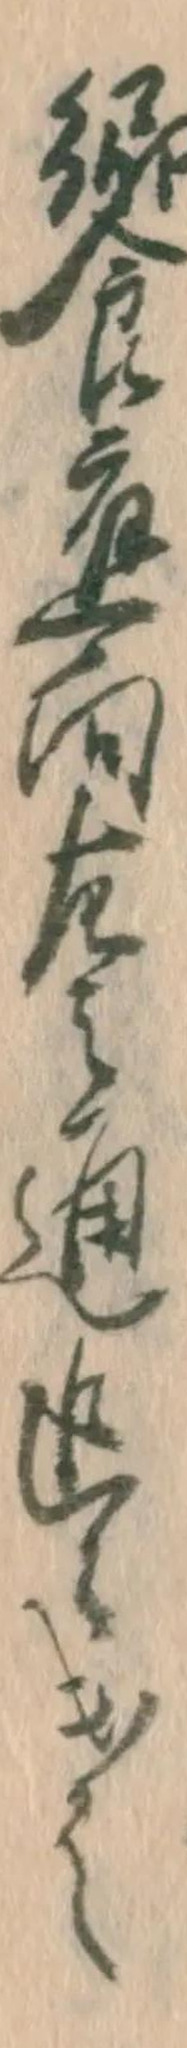饗應向左之通追々出之
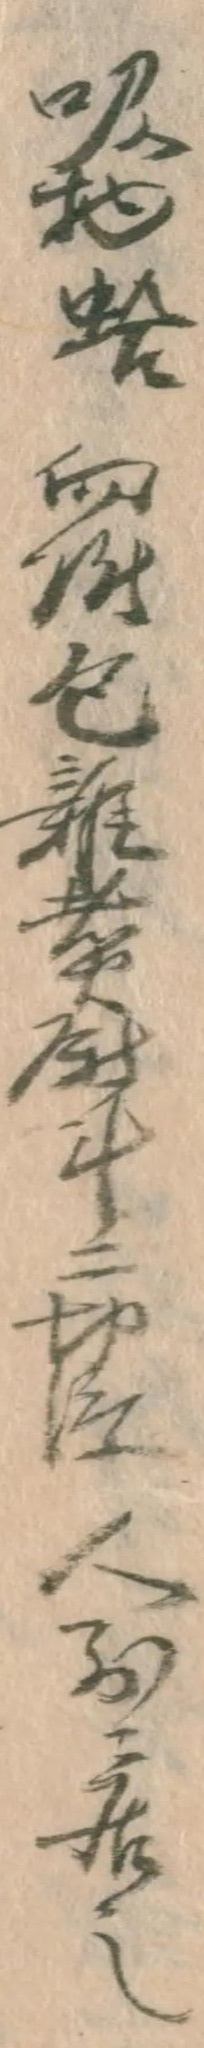吸物蛤向附包雑煮熨斗二切添人別二居之
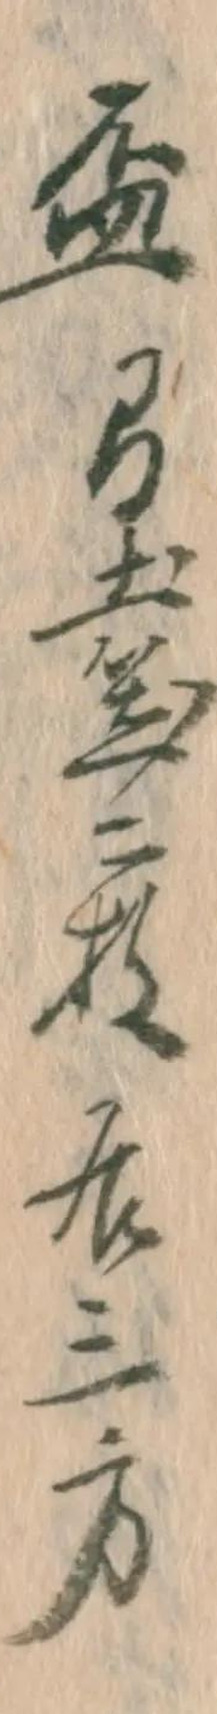盃間土器二枚居三方
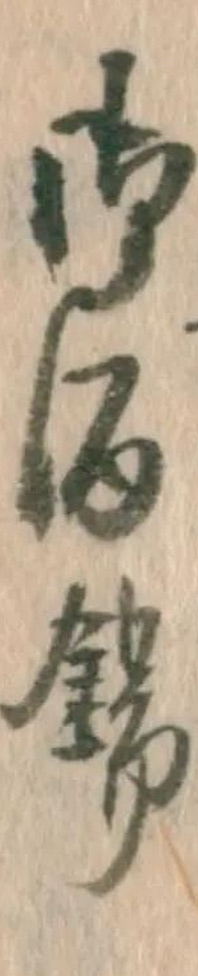御酒錫
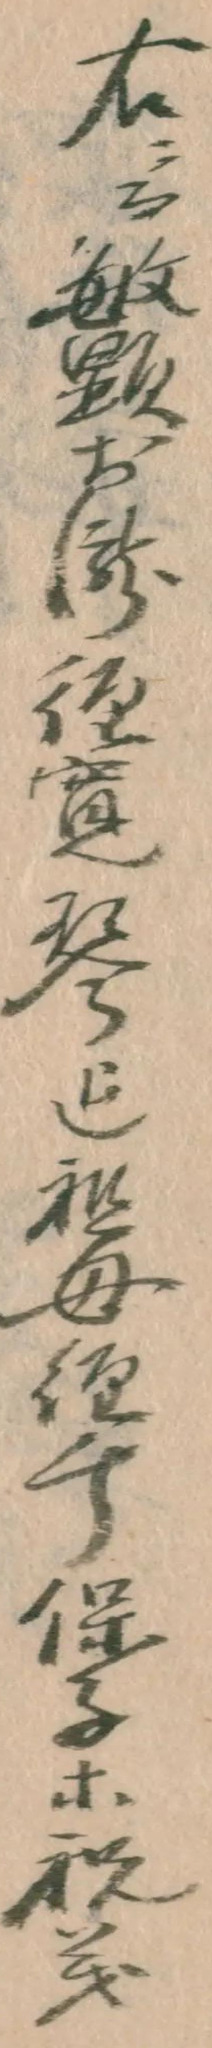右ニ而敏顕お瀧経寛琴迄祖母経千保子等祝義
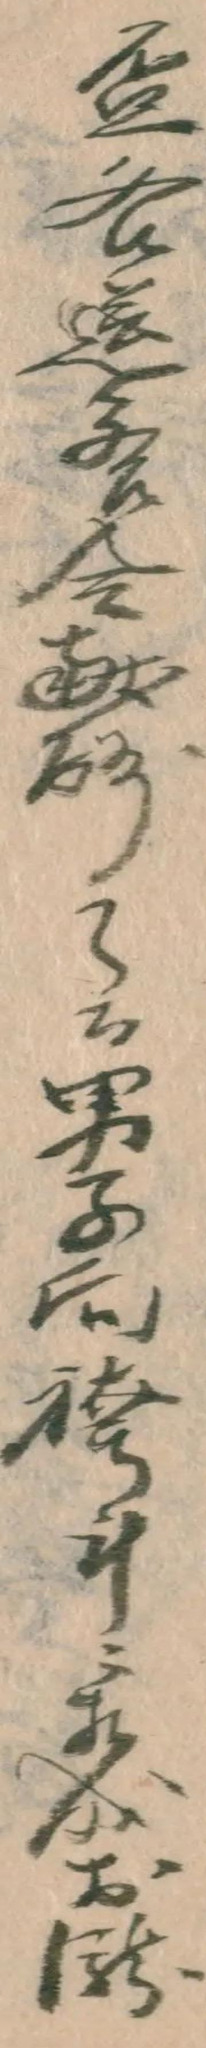盃各送各令献酌了而男子向袴斗ニ相成お瀧
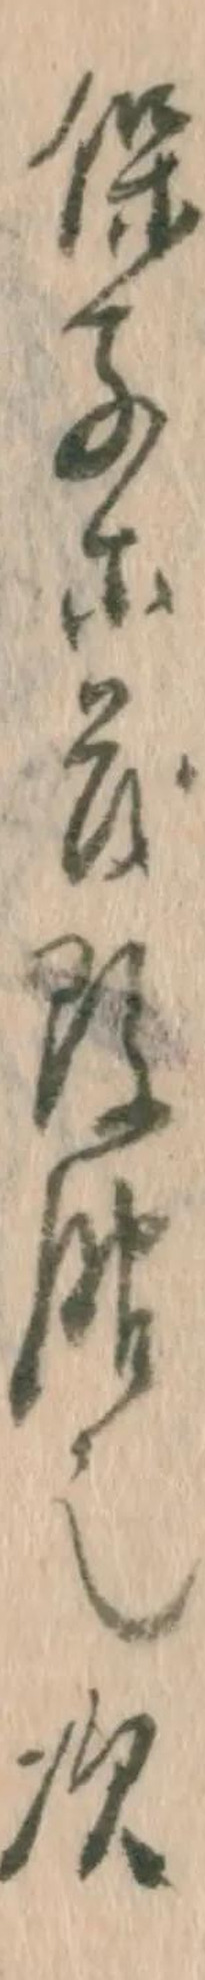保子等にも改服也次
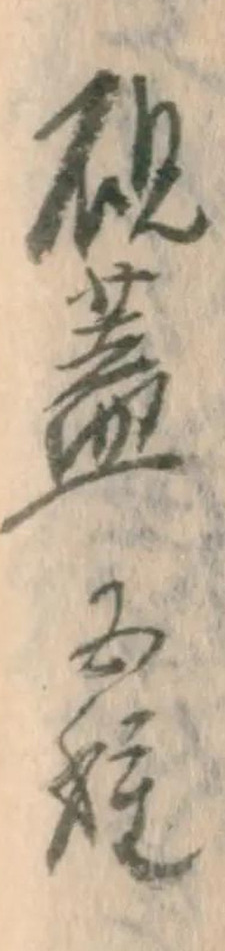硯蓋五種
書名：賀茂社記録. 第67冊
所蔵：国立国会図書館 National Diet Library, JAPAN
